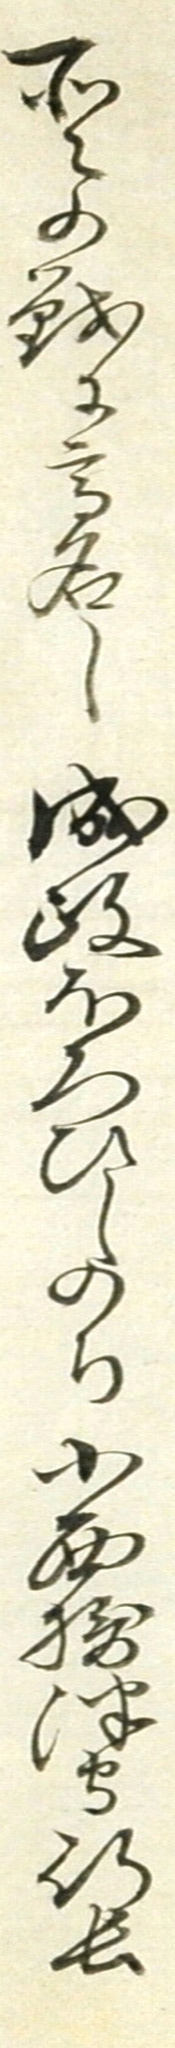所々の戦に高名し成政ほろひしのち小西摂津守行長
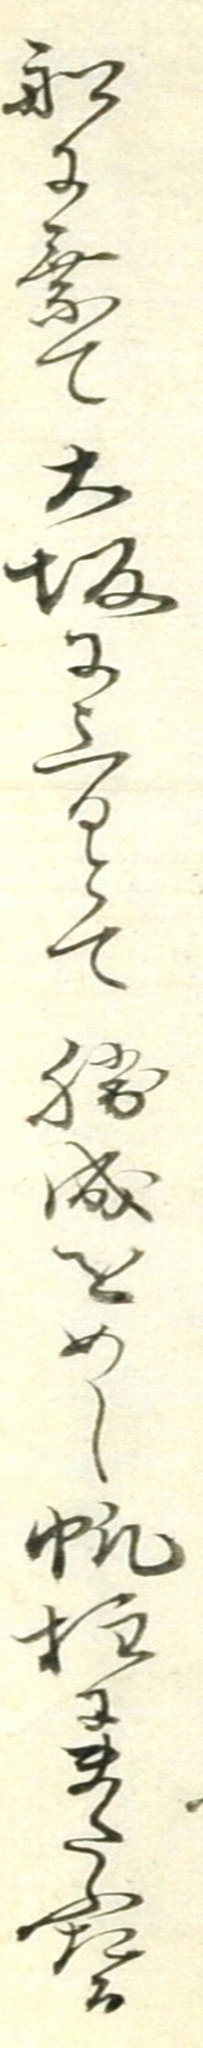船に乗て大坂に上るとて勝成をめし帆柱にまたふたる
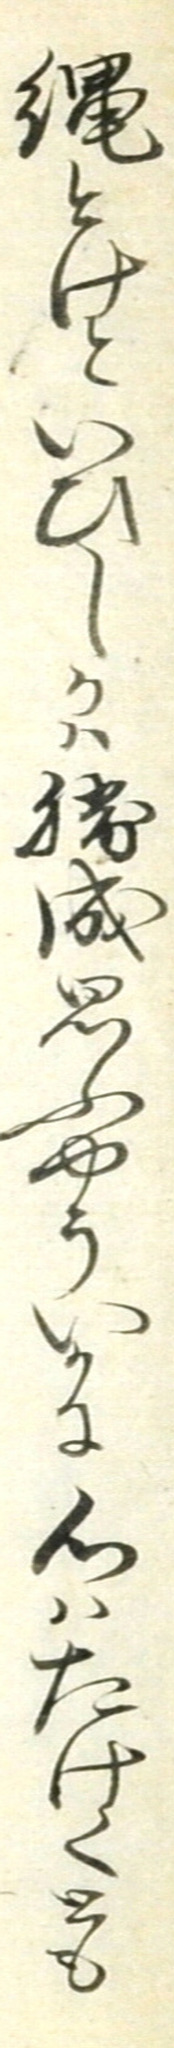縄とけといひしかは勝成思ふやういかに心はたけくとも
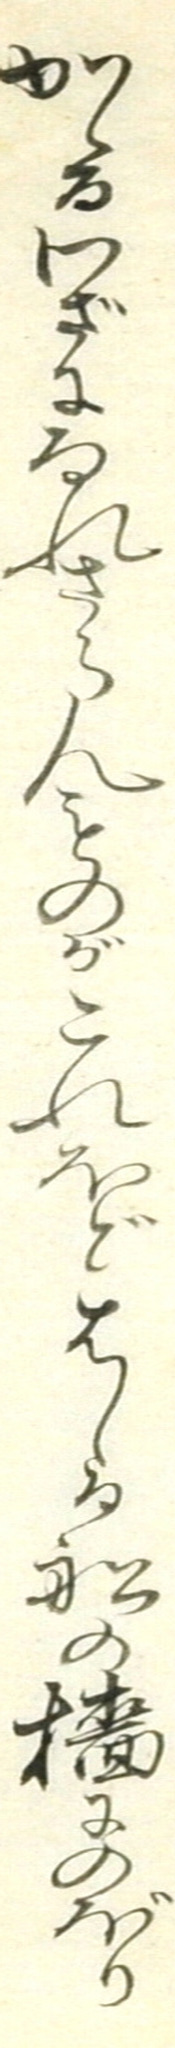かゝるわざになれさらんものがこれほどはしる船の檣にのぼり
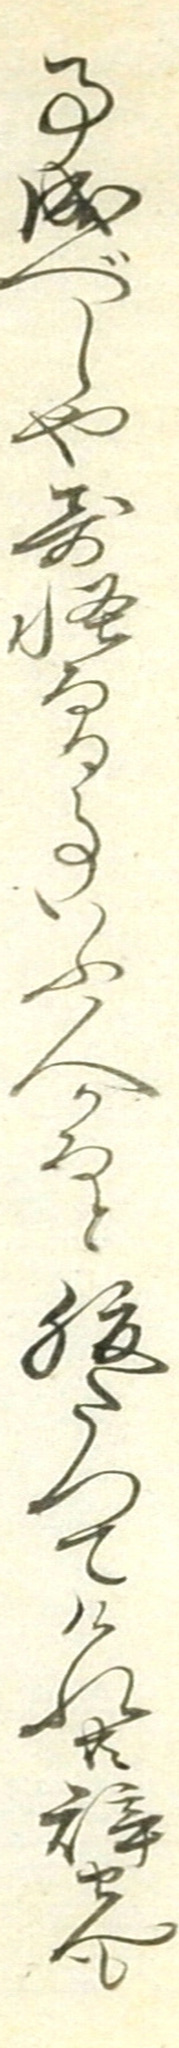事成べしや奇怪なる事いふ人かなと腹たつてけれ共辞せんも
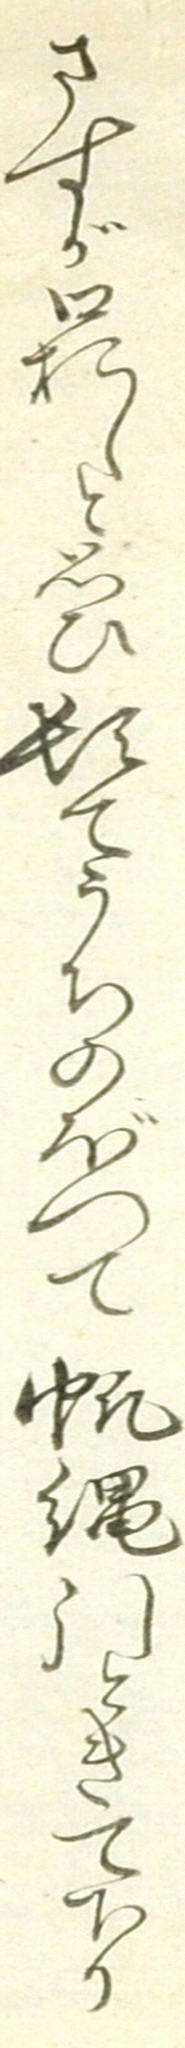さすが口おしと思ひ頓てうちのぼつて帆縄引ときて下り
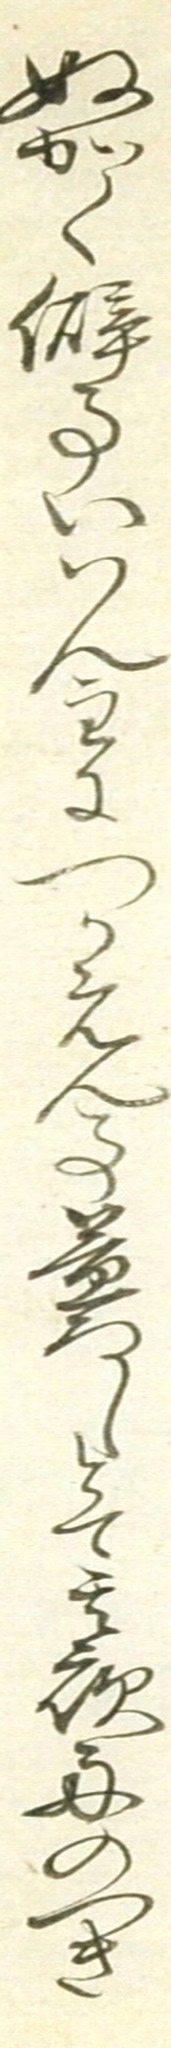ぬかく僻事いはん主につかえん事益なしとて其夜舟のつき
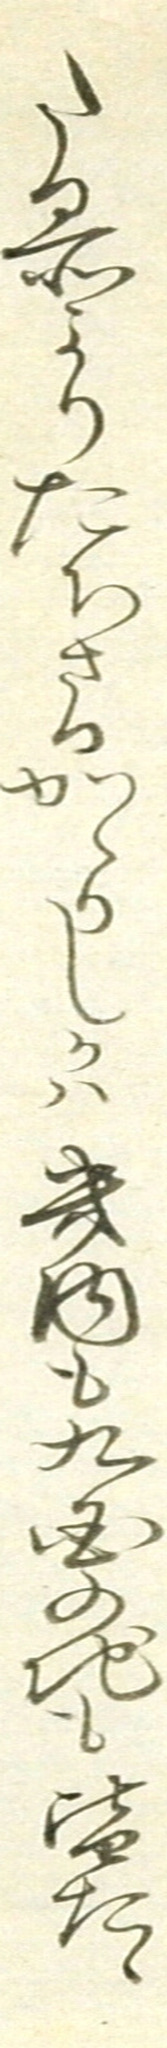たる所よりたちさるかゝりしかはき内も九国の地も皆たゝ

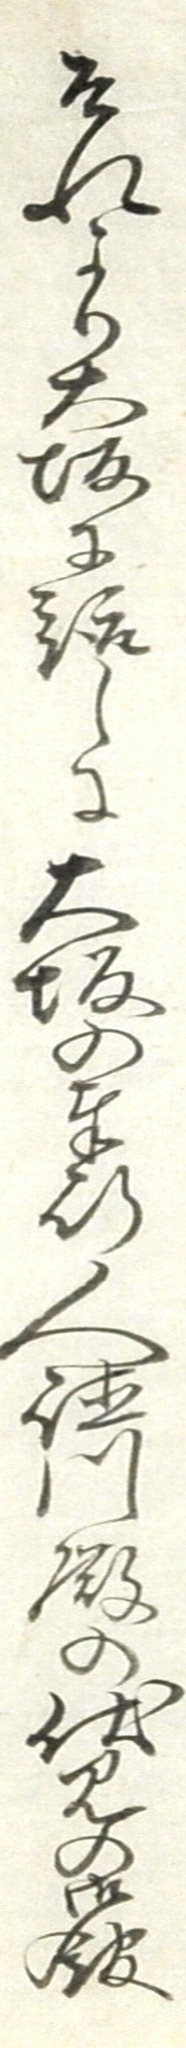それより大坂に趣しに大坂の奉行人徳川殿の伏見の御館
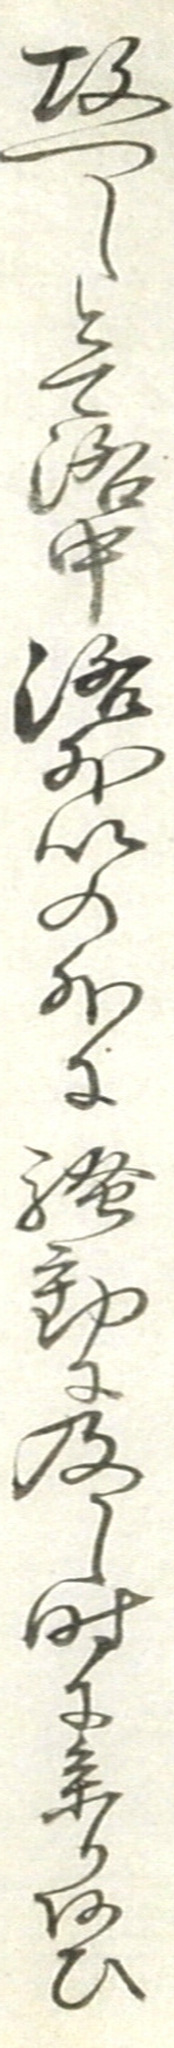攻へしとて洛中洛外以の外に騒動に及し時に参りあひ
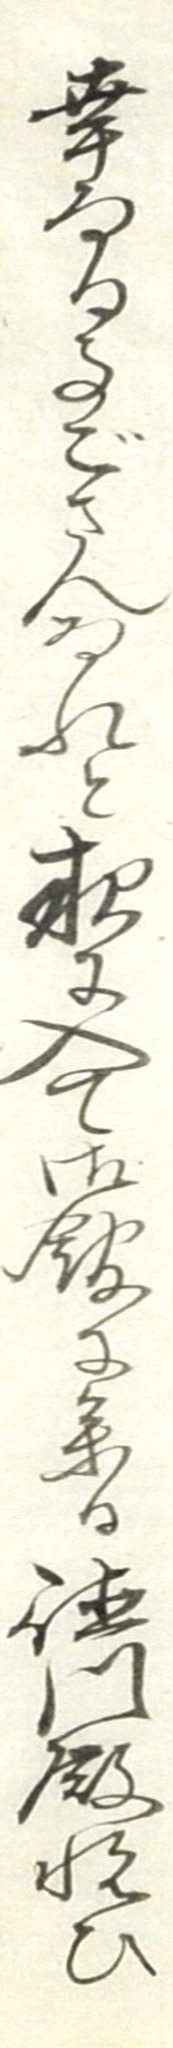幸なる事ごさんなれと夜に入て御館に参る徳川殿悦ひ
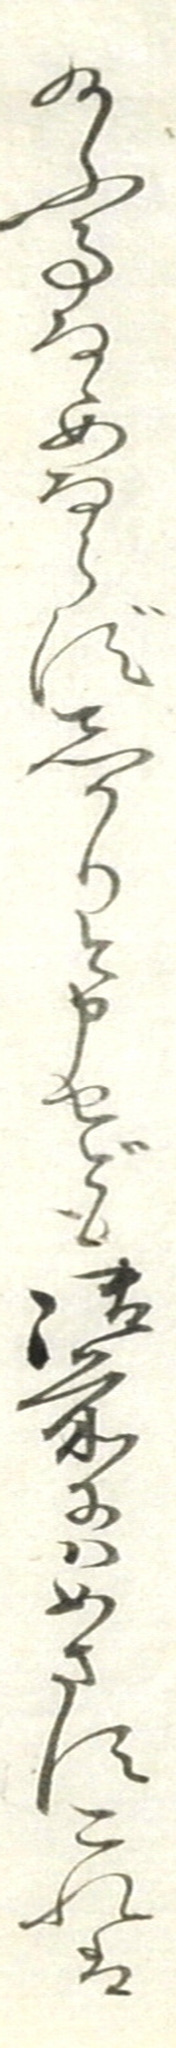給ふ事なゝめならずしかりと申せども御前にはめさすこれは
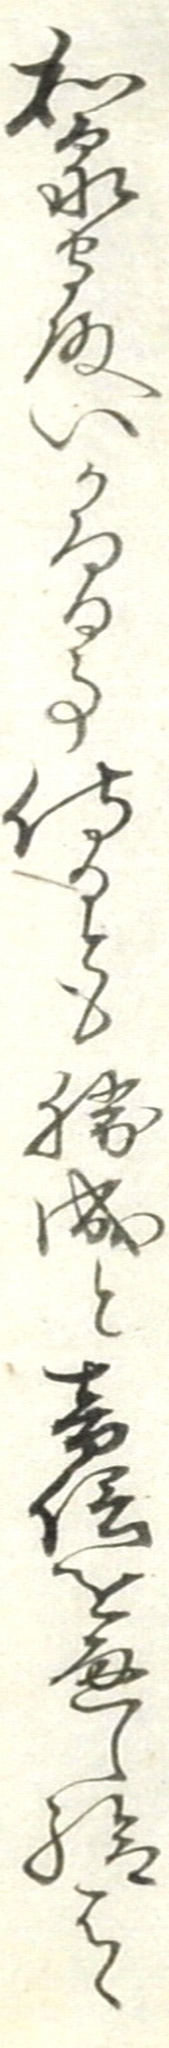和泉守殿いかなる事侍るとも勝成と音信を通し給はゝ
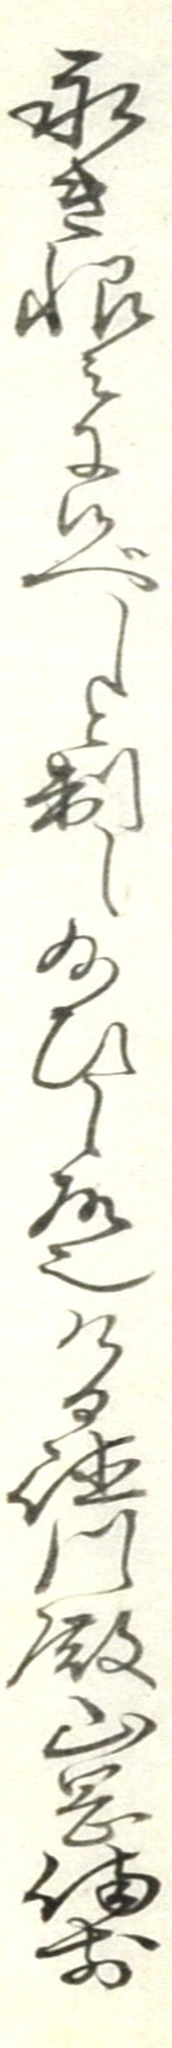永き恨みに候べしと制し給ひし故也ける徳川殿山岡備前
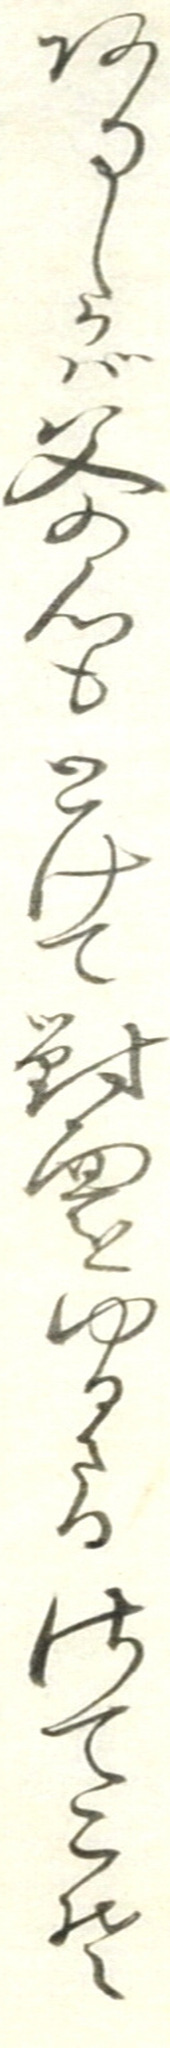ありしかば父の心もとけて対面をゆるさるさてこそ
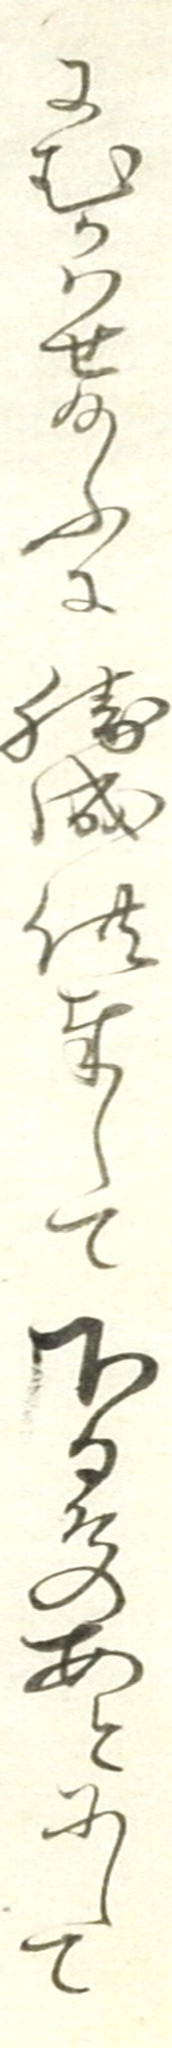にむかわせ給ふに勝成供奉して下るそのあとにして
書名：藩翰譜（二・三）
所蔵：伊那市立高遠町図書館・合同会社AMANE
